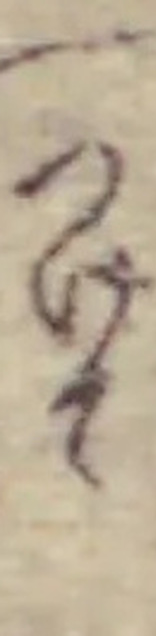つけて
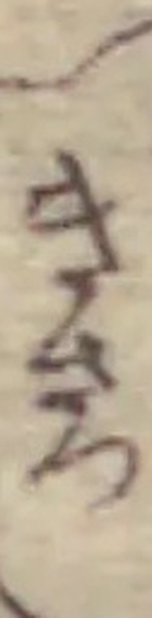きさつ
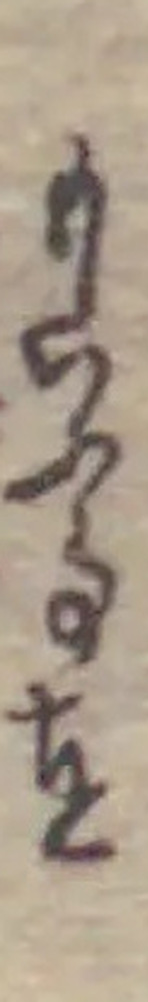もらふ事を
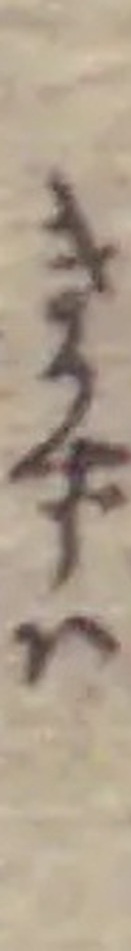きかずは
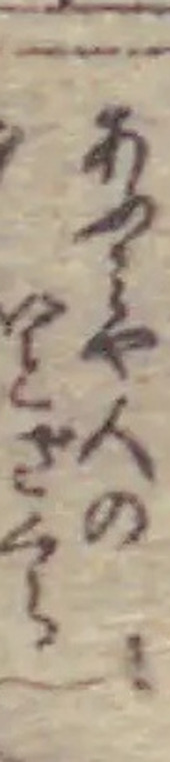あふみや人の
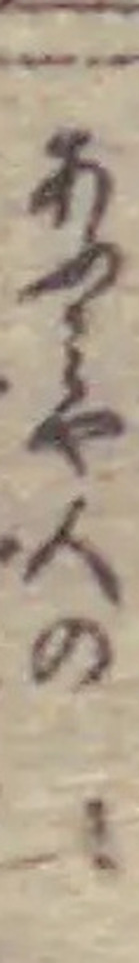あふみや人の
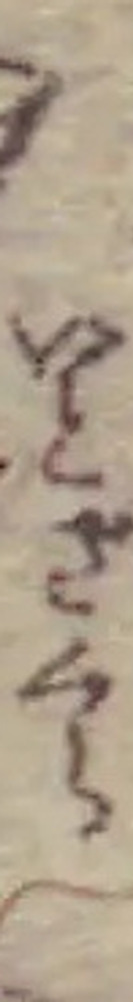いとざくら
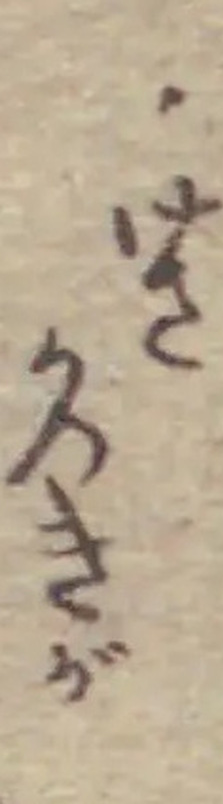かつきが
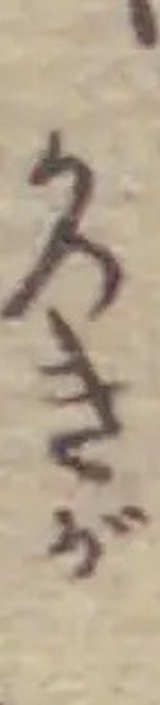かつきが
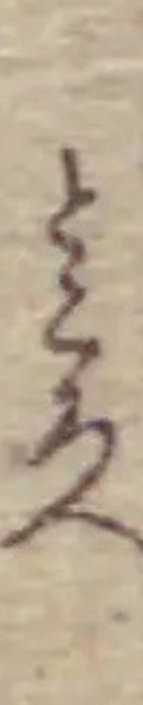ところへ
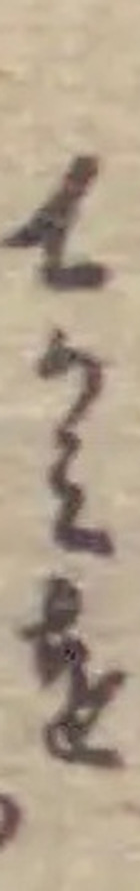てかみを
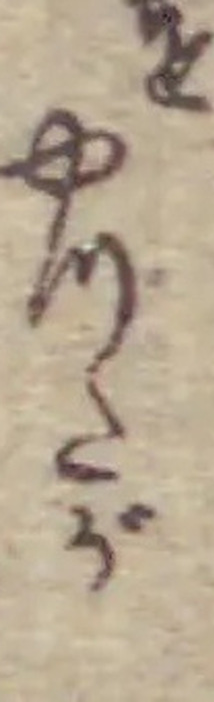やつたが
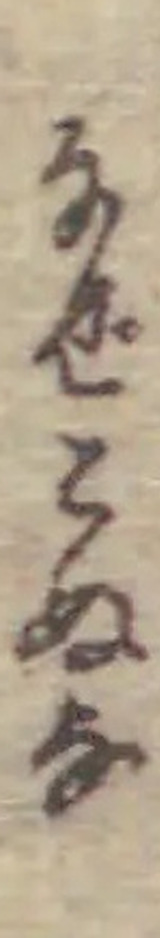なぜこぬな

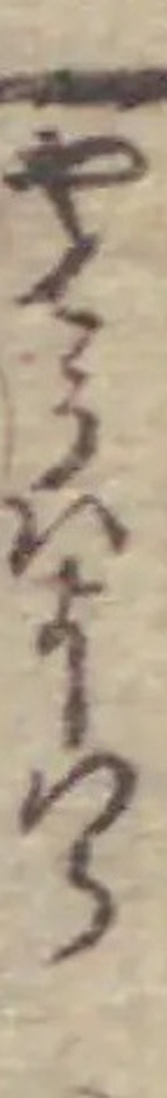やてうはよしはら
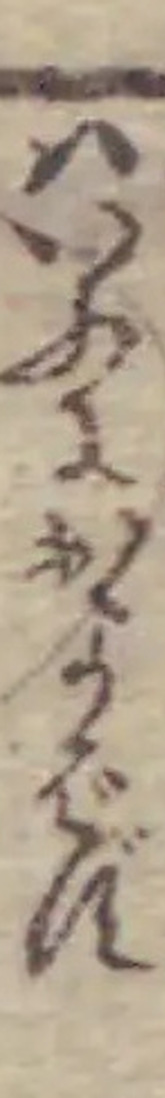はいふにおよばす
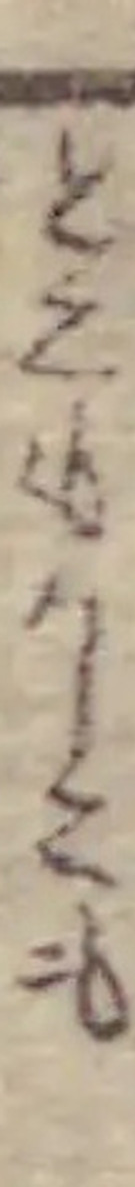とこもかしこも
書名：夜野中狐物 2巻
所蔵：国立国会図書館 National Diet Library, JAPAN
